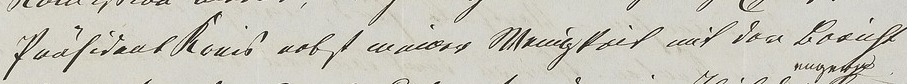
Präsident Kreis nebst meiner Wenigkeit mit der Bericht
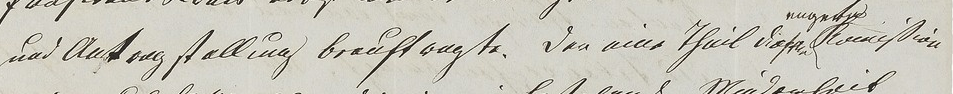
und Antragstellung beauftragte. Der eine Theil dieser engern Komission
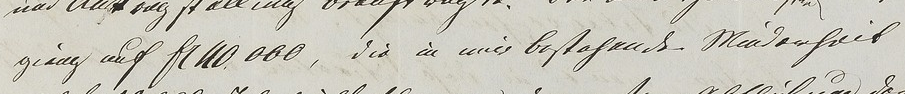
gieng auf fr 40,000, die in mir bestehende Minderheit
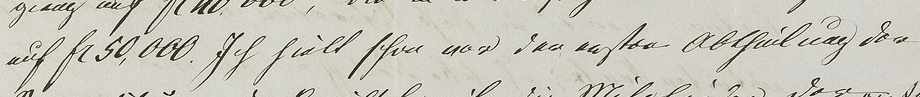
auf fr 50,000. Ich hielt schon vor der ersten Abtheilung der
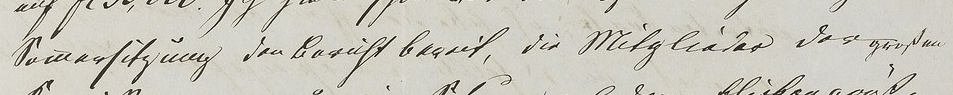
Sommersitzung den Bericht bereit, die Mitglieder der großen
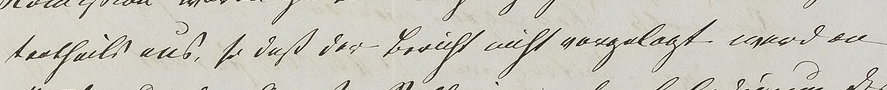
tentheils aus, so daß der Bericht nicht vorgelegt werden
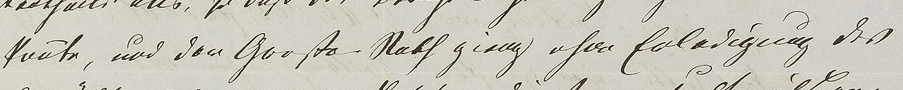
konnte, und der Große Rath gieng ohne Erledigung des
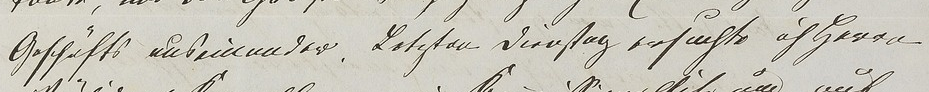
Geschäfts auseinander. Letzten Dienstag ersuchte ich Herrn
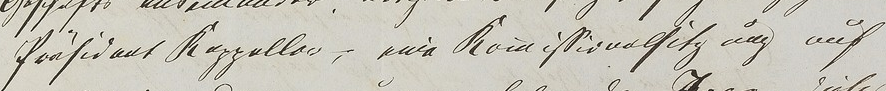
Präsident Kappeller, eine Kommissionssitzung auf
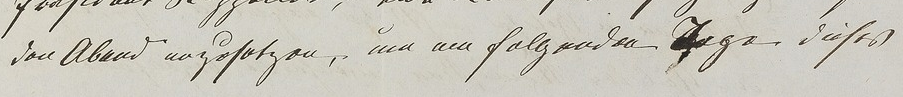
den Abend anzusetzen, um am folgenden Tage dieses
